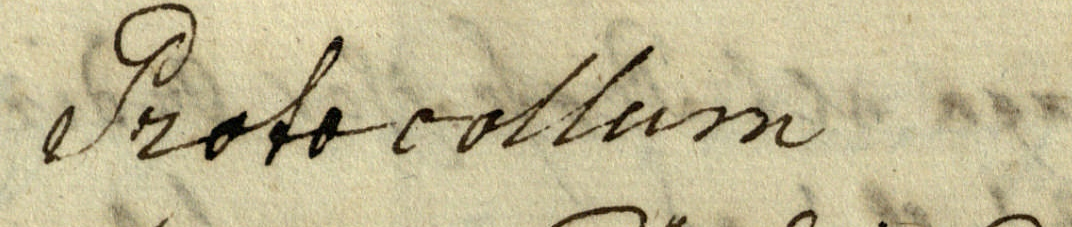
Protocollum
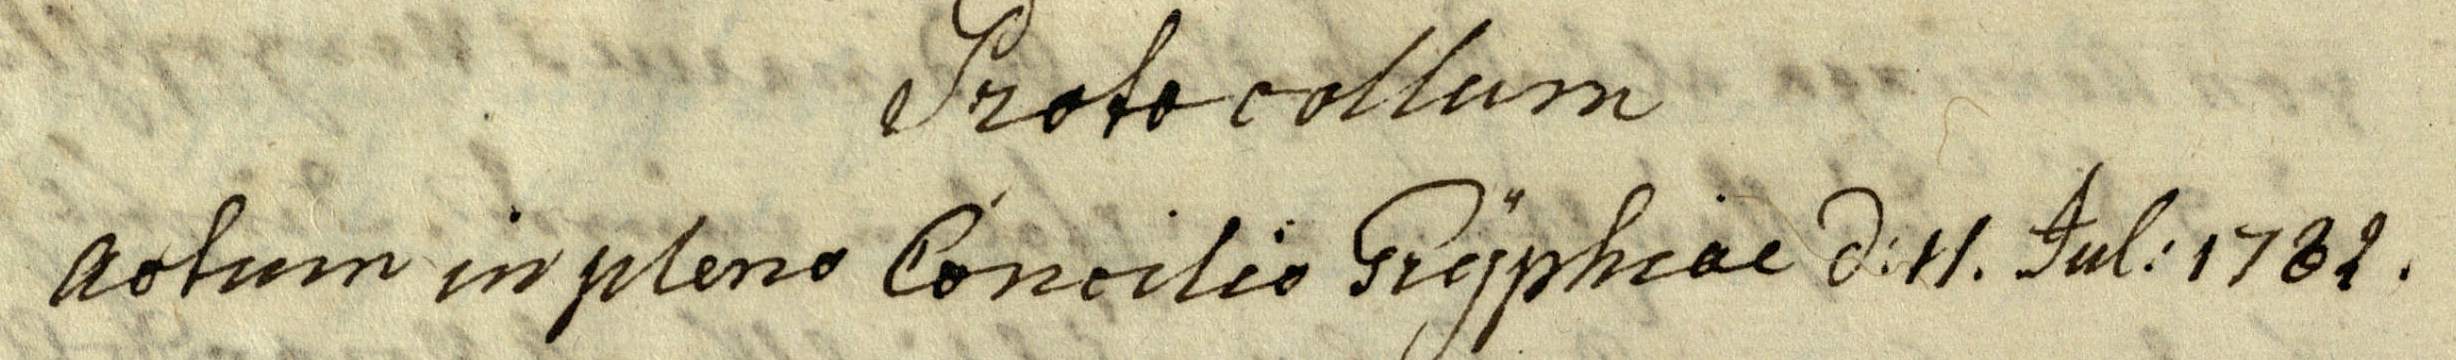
Actum in pleno Concilio Gryphiae d. 11. Jul. 1782
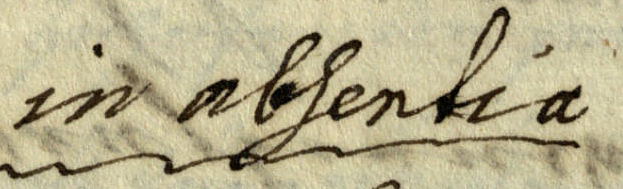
in absentia
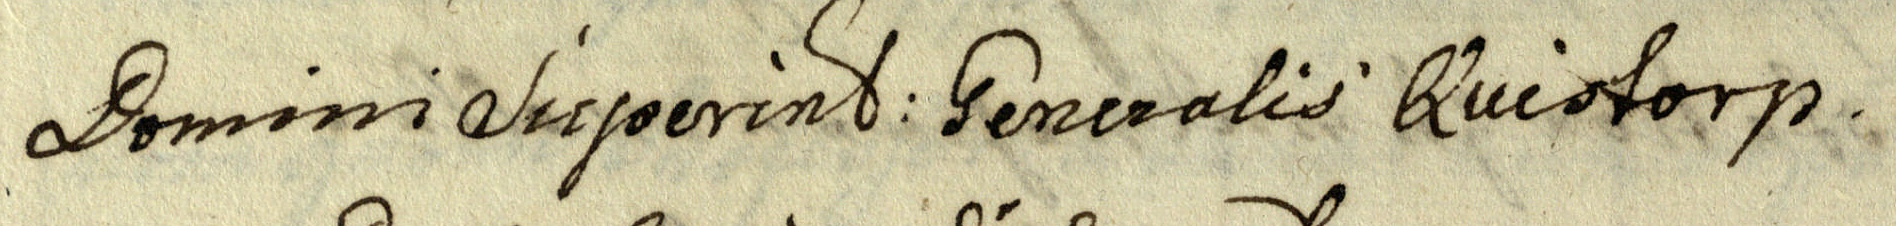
Domini Superint. Generalis Quistorp
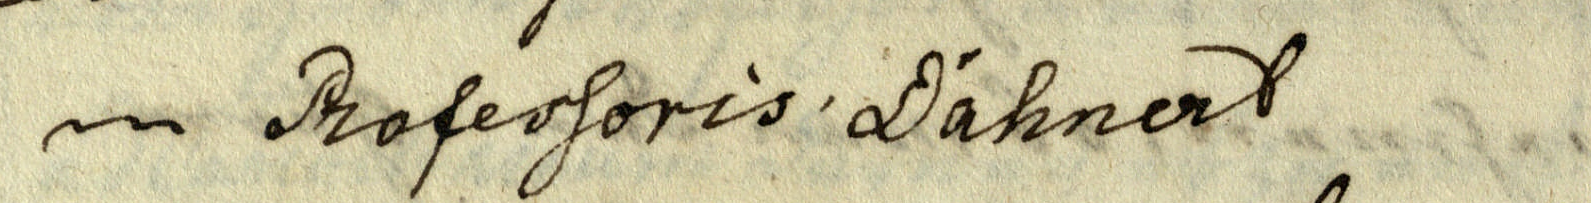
Professoris Dähnert
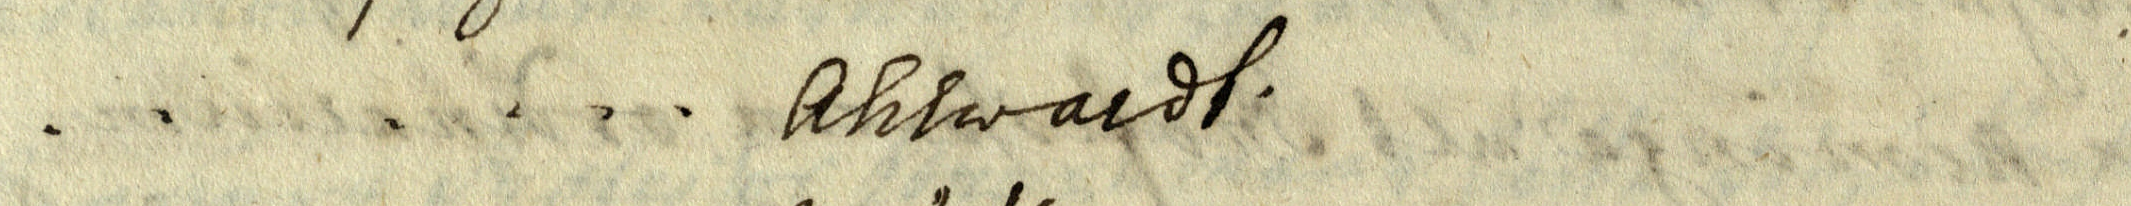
Ahlwardt.
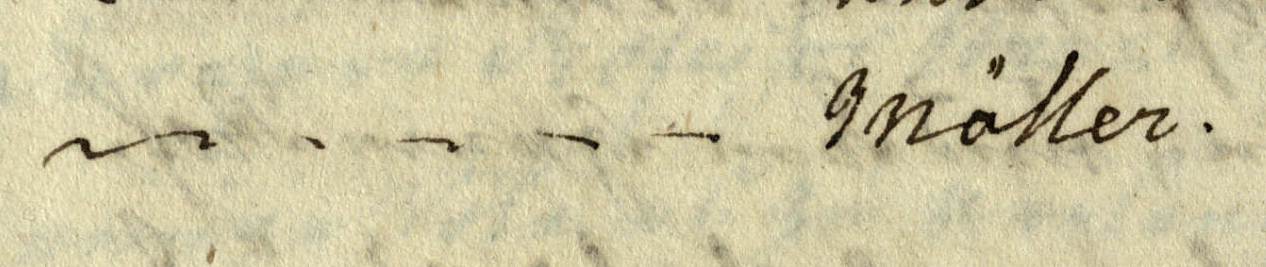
Möller.
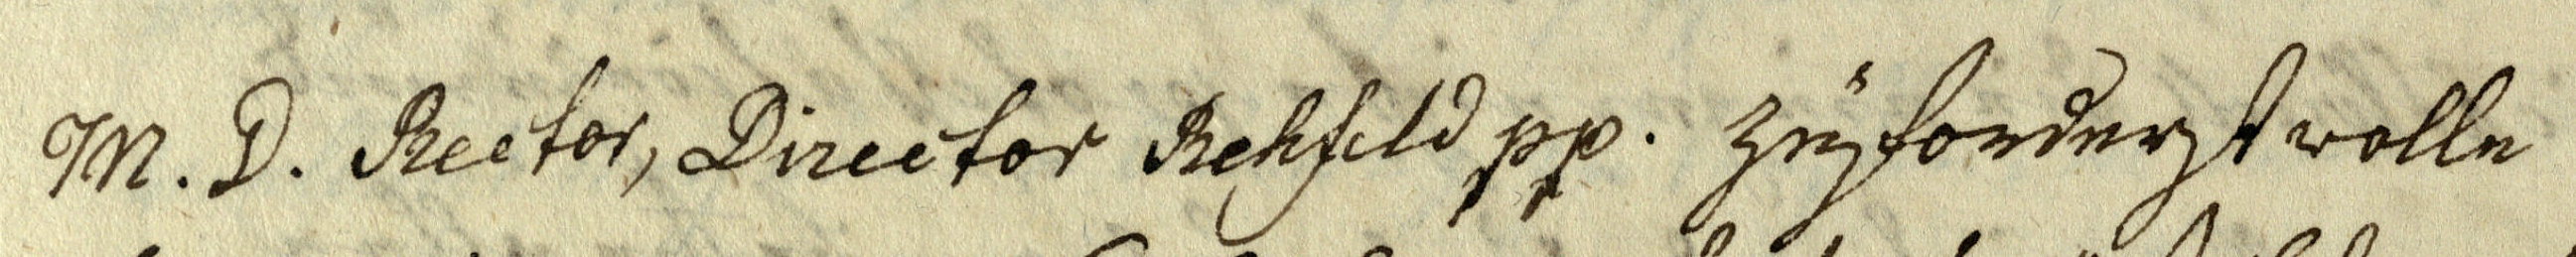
M. D. Rector, Director Rehfeld pp. zuforderst wolle
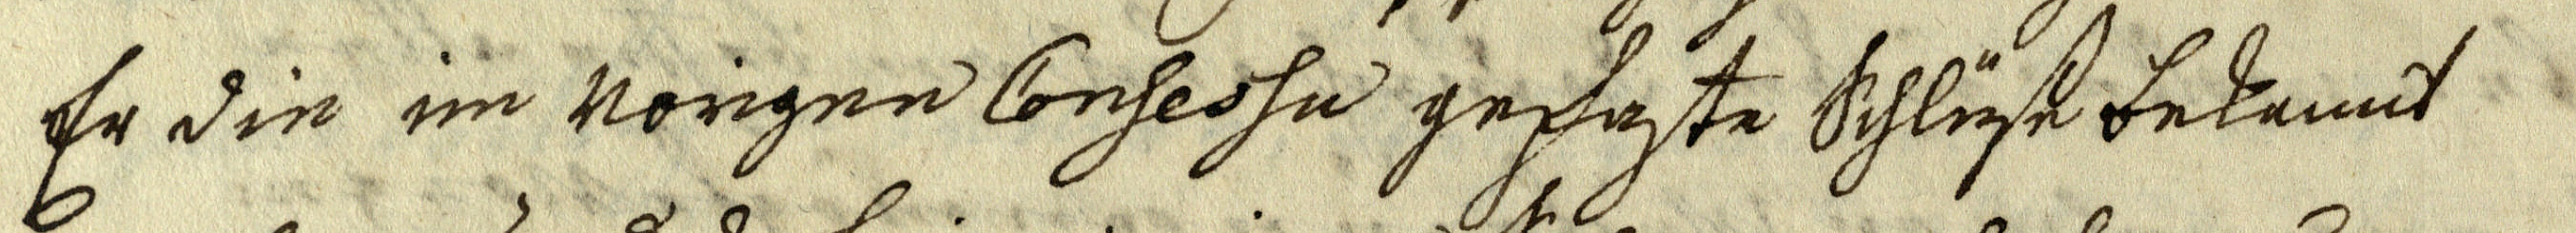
Er die im vorigen Consessu gefaste Schlüße bekannt
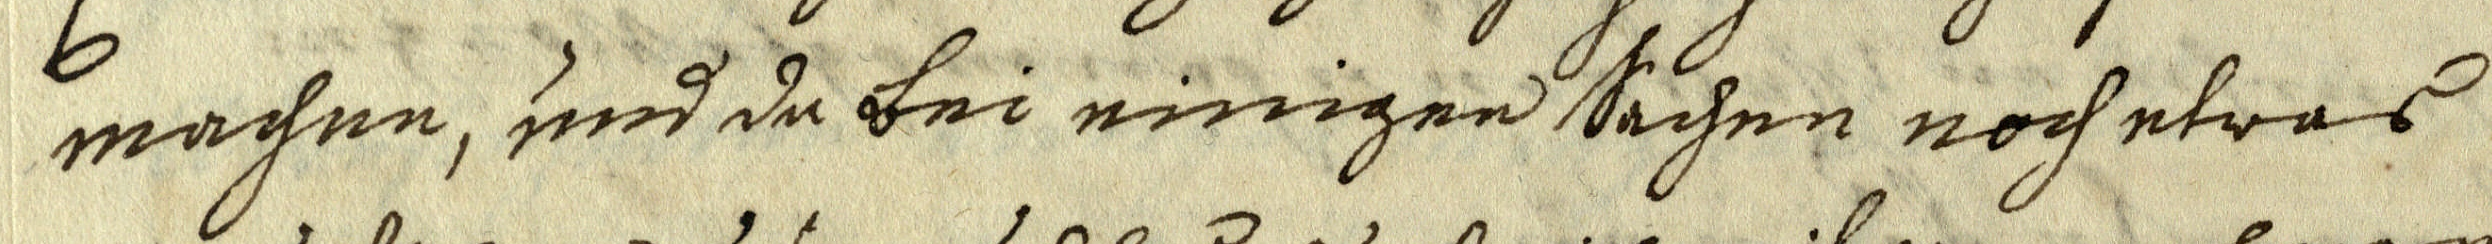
machen, und da bei einigen Sachen noch etwas
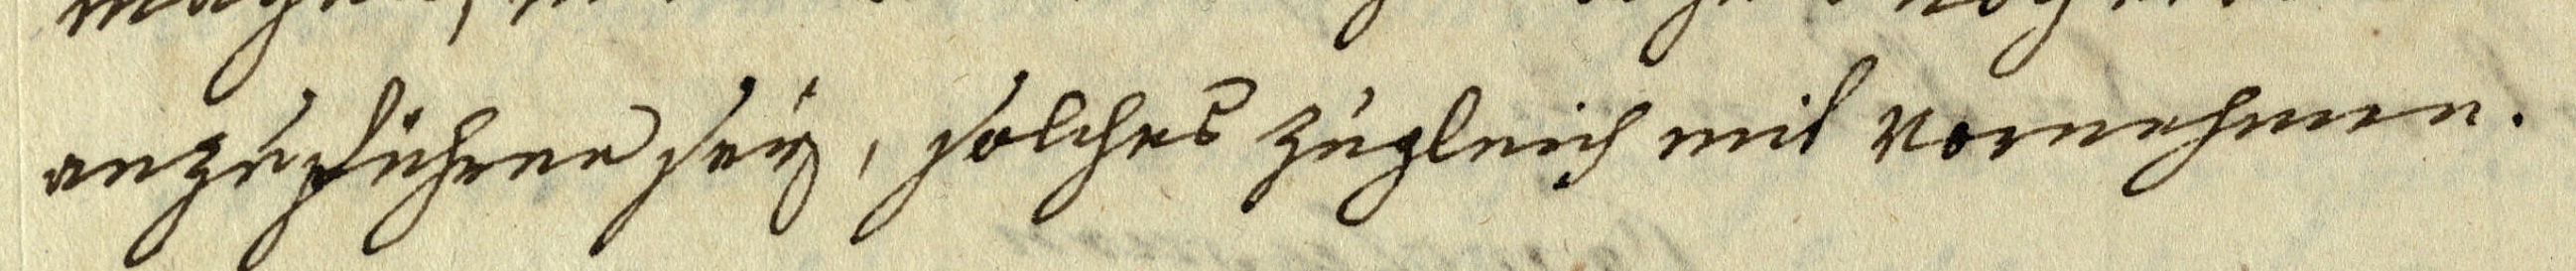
anzuführen seÿ, solches zugleich mit vornehmen.
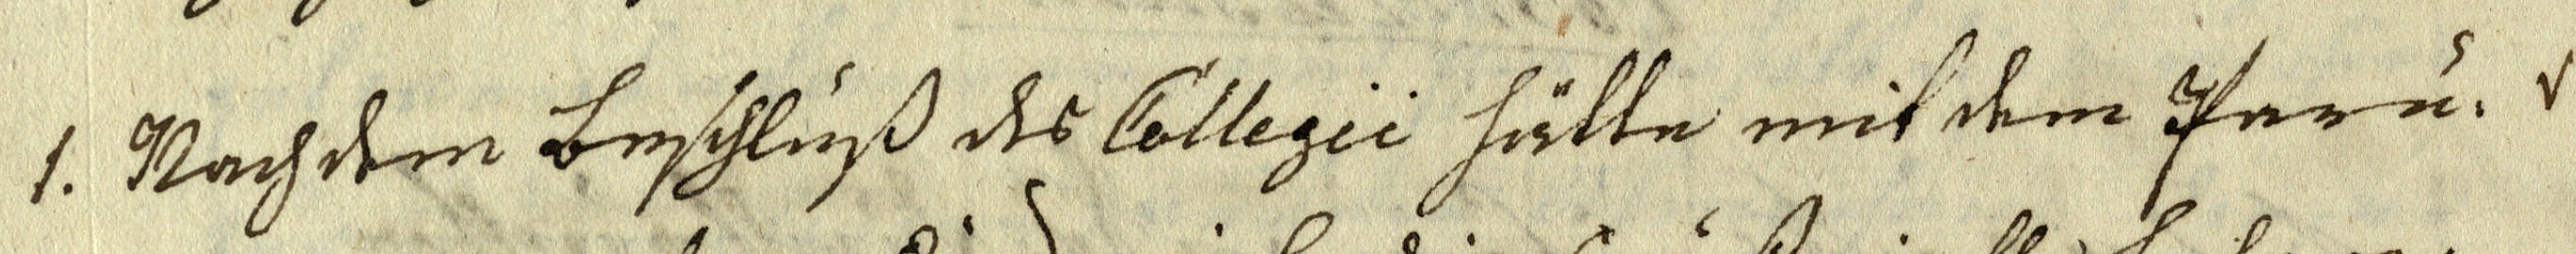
1. Nach dem Beschluß der Collegii hätte mit dem Paru¬
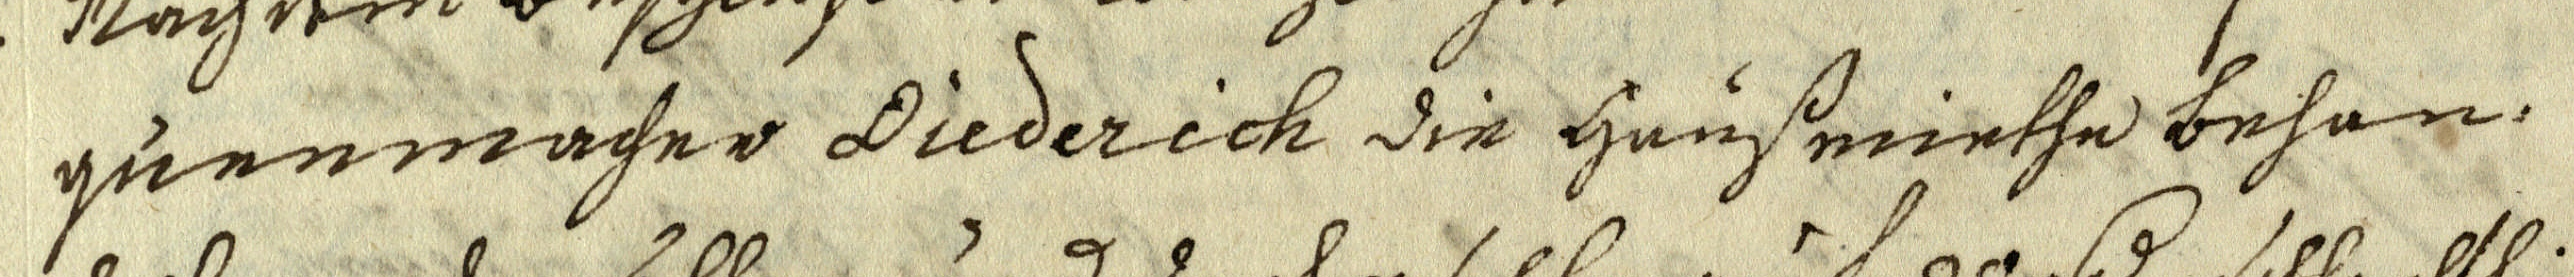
quenmacher Diederich die Haußmiethe behan¬
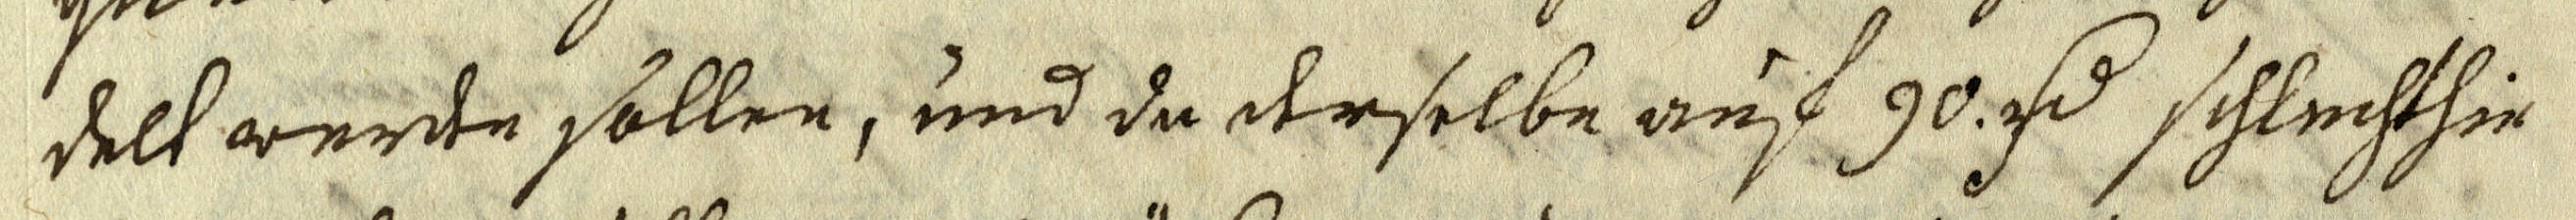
delt werden sollen, und da derselbe auf 90. r. schlechthin
